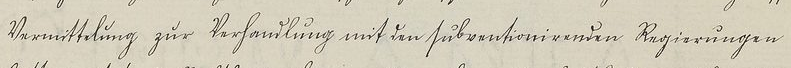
Vermittelung zur Verhandlung mit den subventionirenden Regierungen
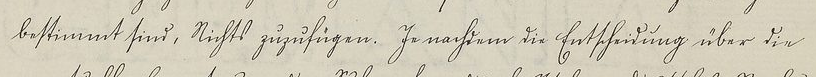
bestimmt sind, Nichts zuzufügen. Je nachdem die Entscheidung über die
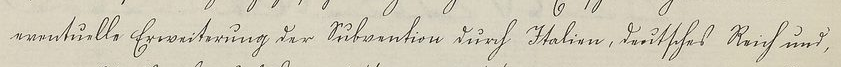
eventuelle Erweiterung der Subvention durch Italien, deutsches Reich und,
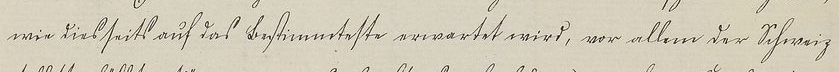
wie diesseits auf das Bestimmteste erwartet wird, vor allem der Schweiz
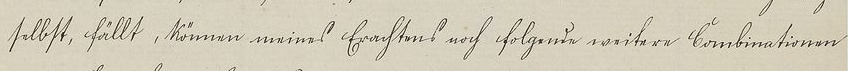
selbst, fällt, können meines Erachtens noch folgende weitere Combinationen
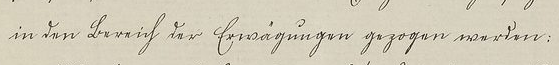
in den Bereich der Erwägungen gezogen werden:
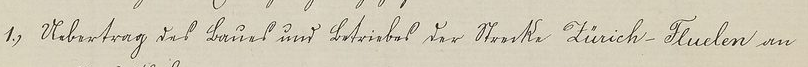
1.) Uebertrag des Baues und Betriebes der Strecke Zürich–Fluelen an
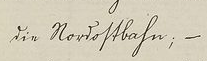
die Nordostbahn; –
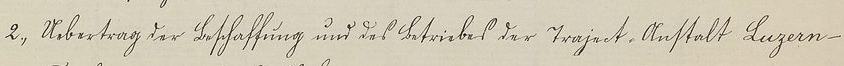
2.) Uebertrag der Beschaffung und des Betriebes der Traject-Anstalt Luzern–-
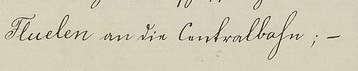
Fluelen an die Centralbahn;
